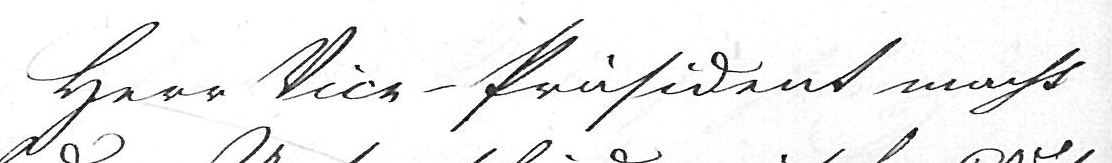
Herr Vice-Präsident macht
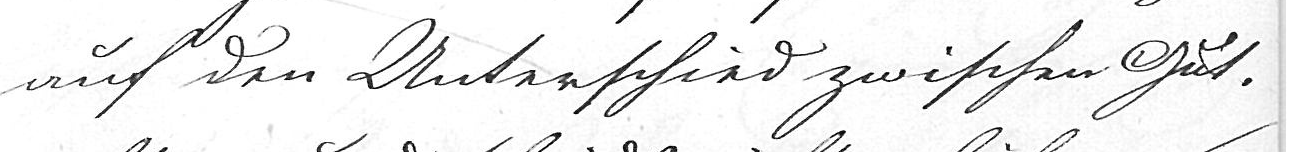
auf den Unterschied zwischen Gut-
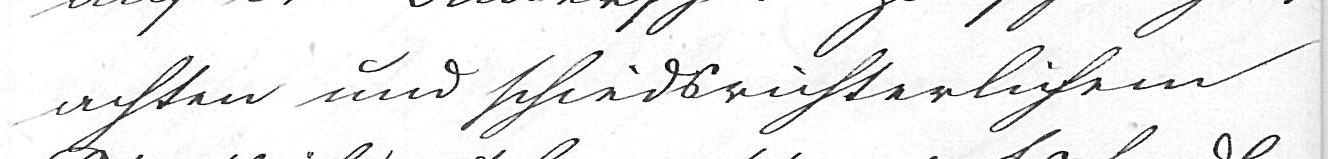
achten und schiedsrichterlichem
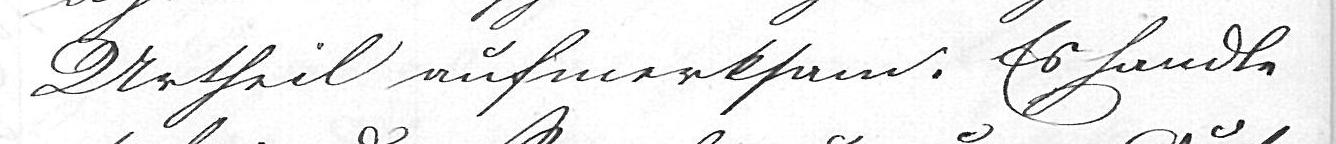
Urtheil aufmerksan. Es handle
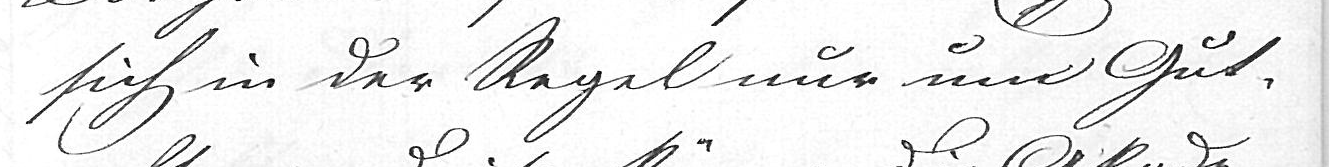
sich in der Regel nur um Gut-
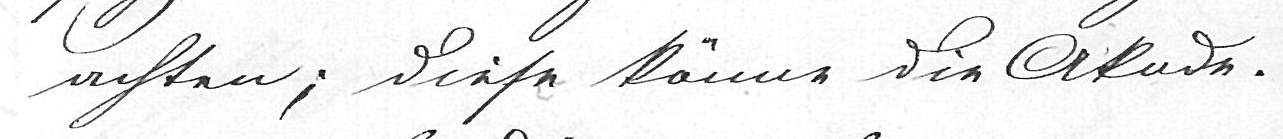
achten; diese könne die Akade-
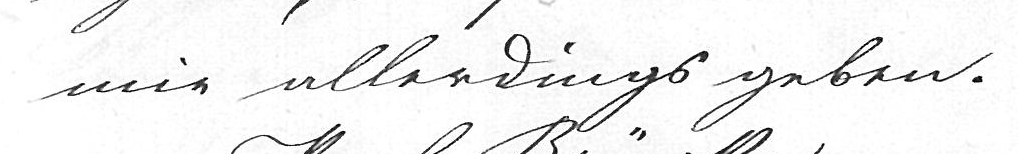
mie allerdings geben.
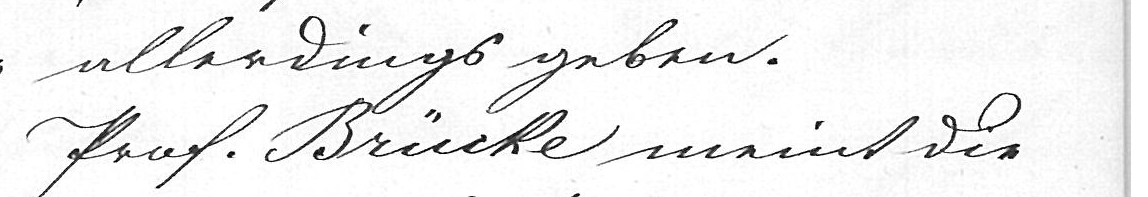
Prof. Brücke meint die
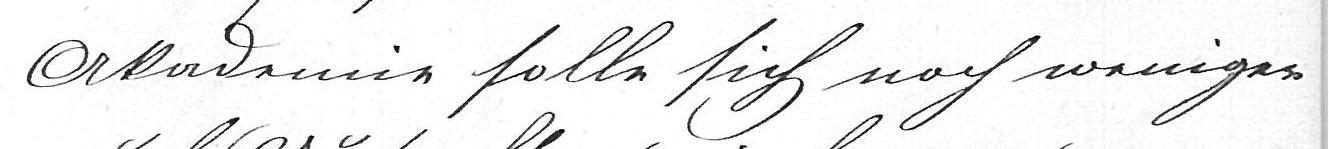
Akademie solle sich noch weniger
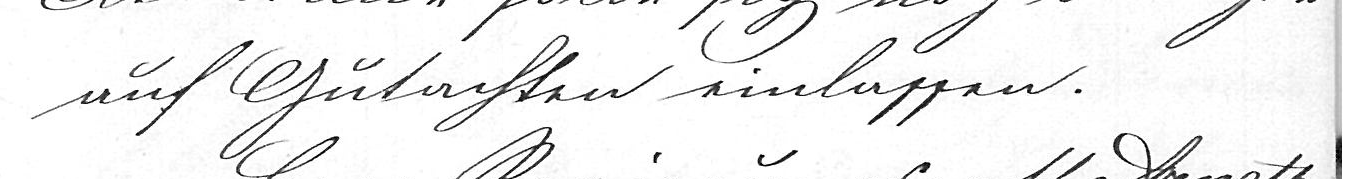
auf Gutachten einlassen.
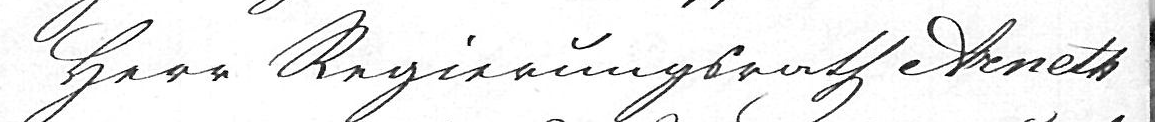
Herr Regierungsrath Arneth
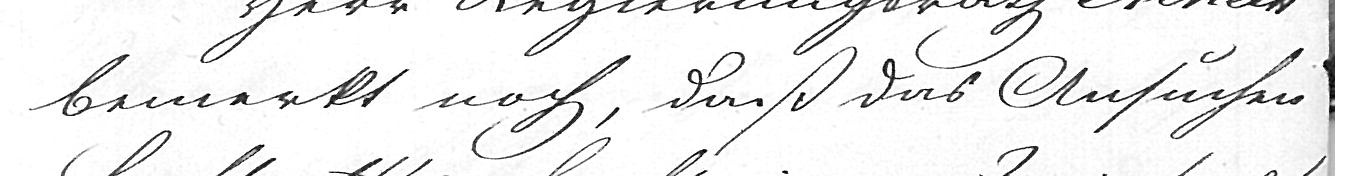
bemerkt noch, daß das Ansuchen
